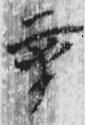辛
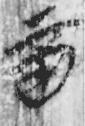梄（酉）
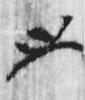之
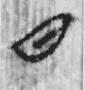日
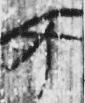不
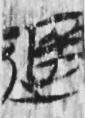𬨭（將）
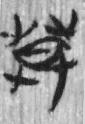登
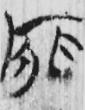厞
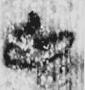㠯（以）
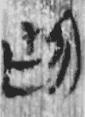○（廷）
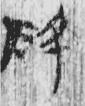阩
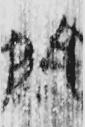門
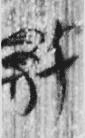敗
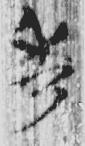秀
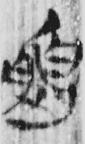○（履）
